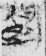○（夏）
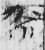○（夕）
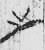之
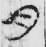月
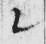乙
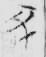丑
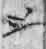之
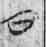日
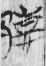○（喜）
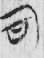司
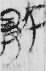敗
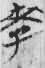李
